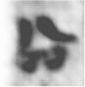公
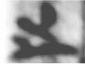之
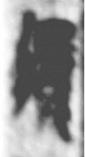○（驒）
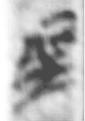爲
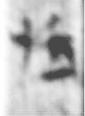○（左）
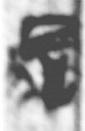○（服）
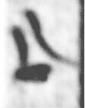公
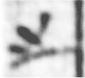之
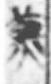黃
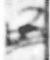爲
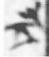○（右）
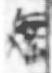○（服）
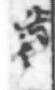韒
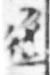○（路）
